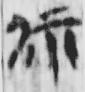𫵖
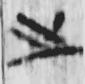之
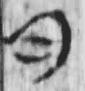月
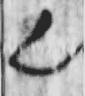乙
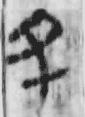丑
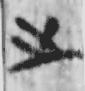之
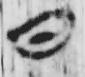日
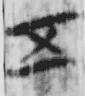五
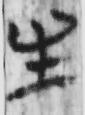生
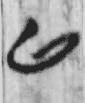㠯（以）
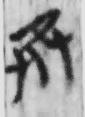丞
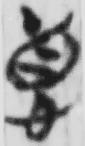惪
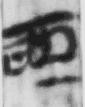爲
